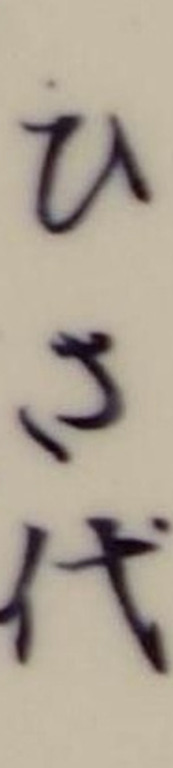ひさ代
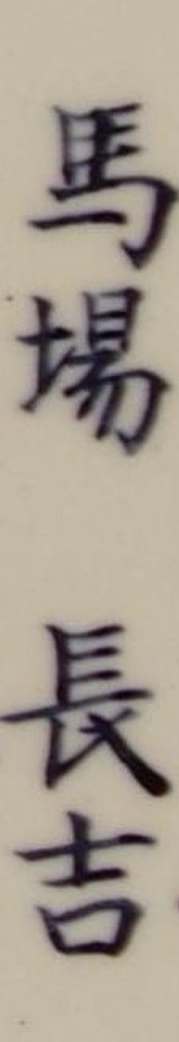馬場長吉
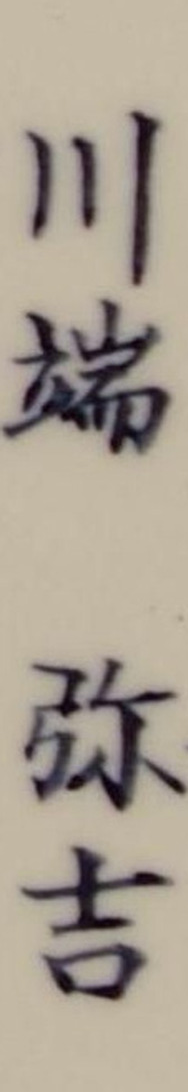川端弥吉
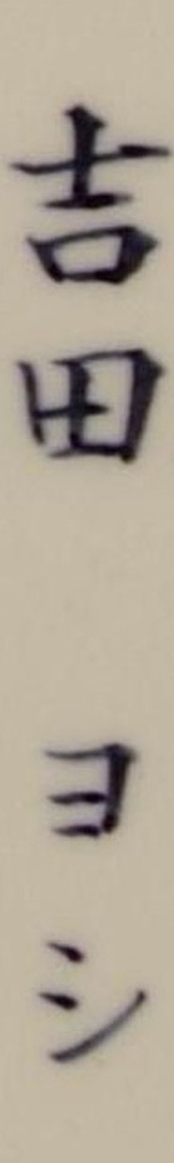吉田ヨシ
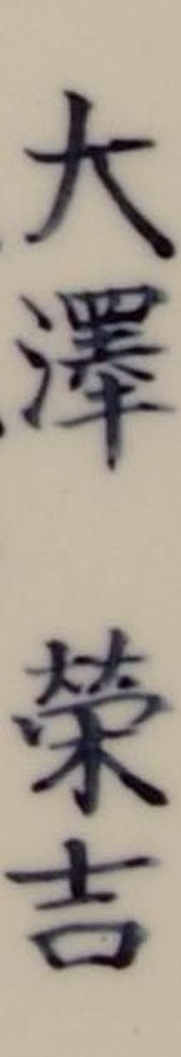大澤榮吉
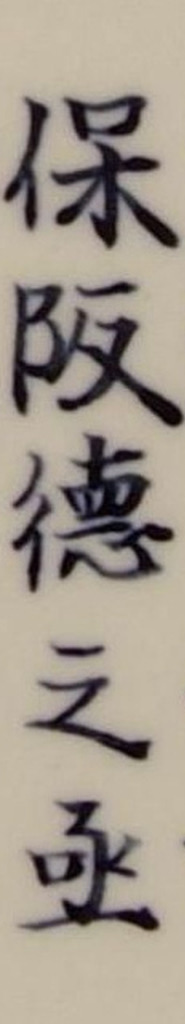保阪徳之丞
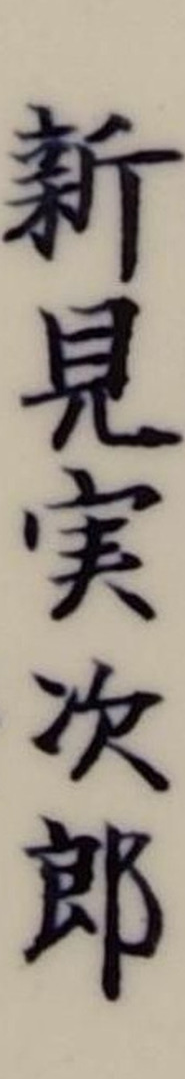新見実次郎
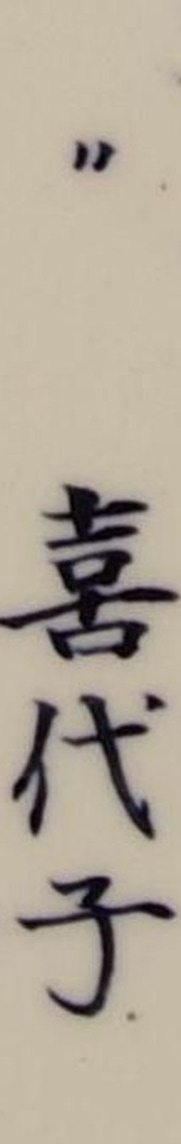喜代子
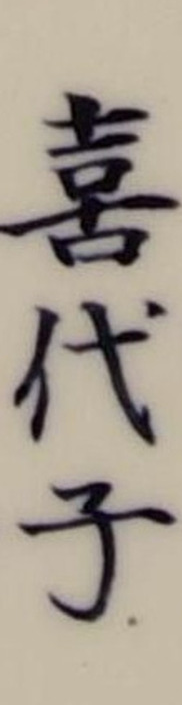喜代子
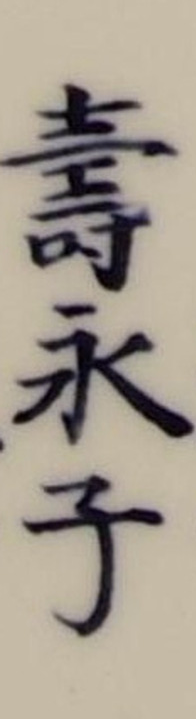壽永子
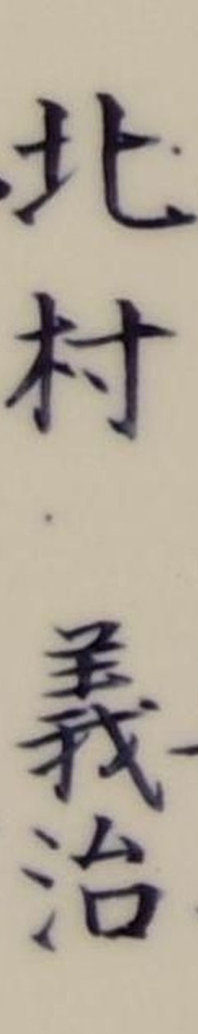北村義治
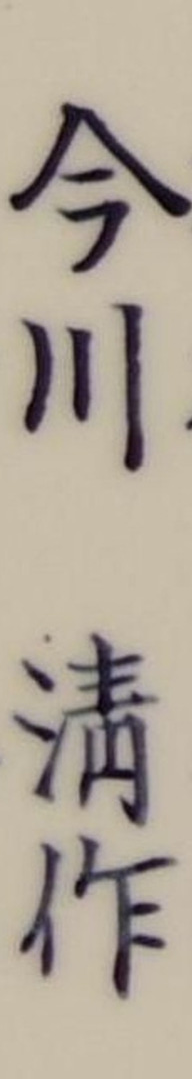今川清作
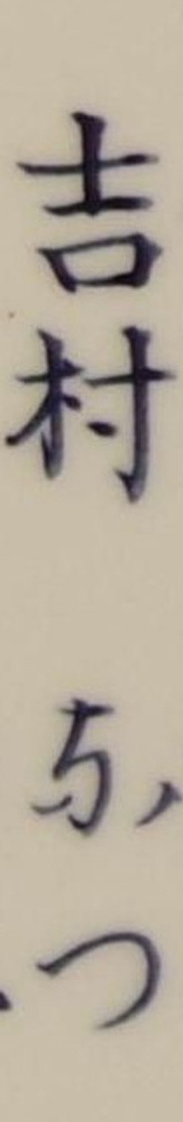吉村なつ

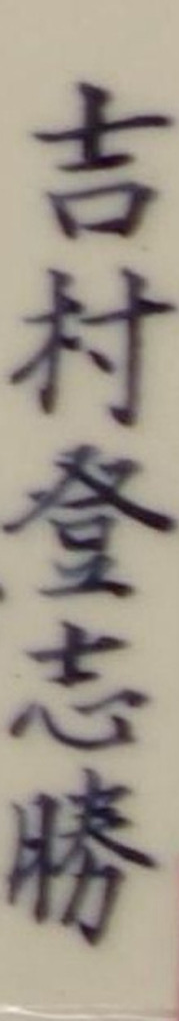吉村登志勝
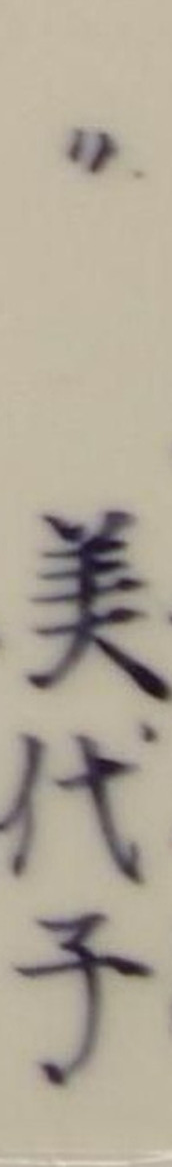美代子
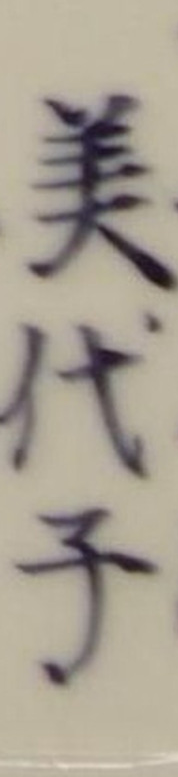美代子
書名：M~S
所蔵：高野山金剛峯寺
